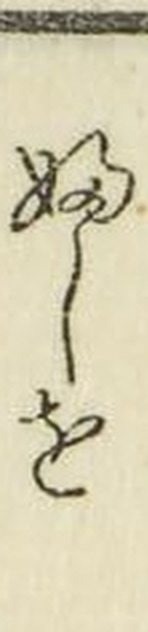ふしを
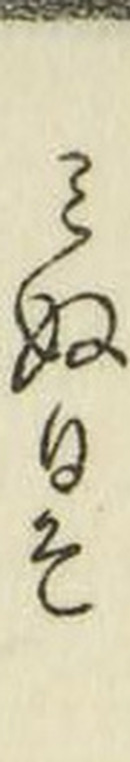みぬ日そ
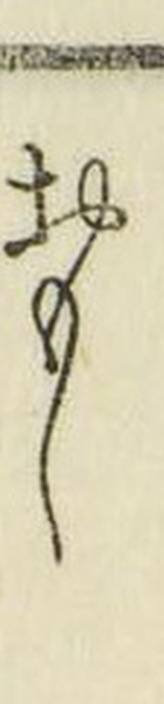おもし
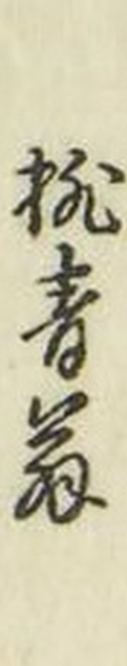桃青翁

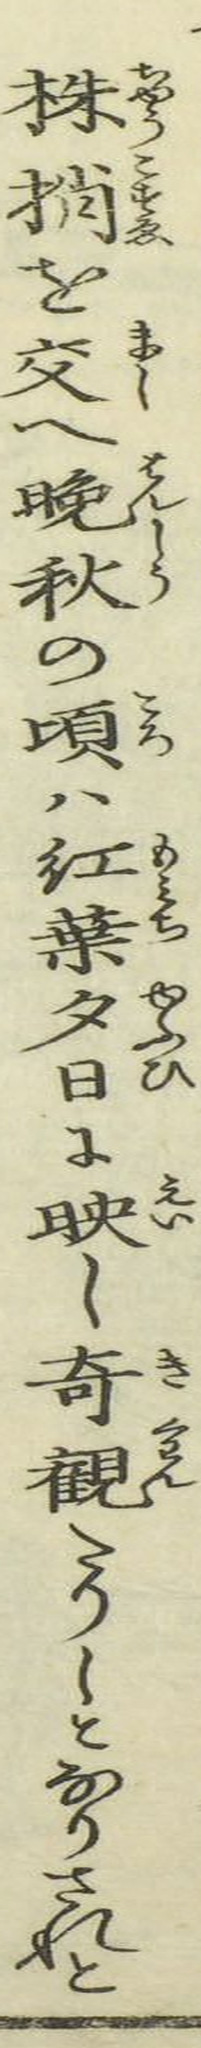株梢を交へ晩秋の頃は紅葉夕日に映し奇観たりしとなりされと
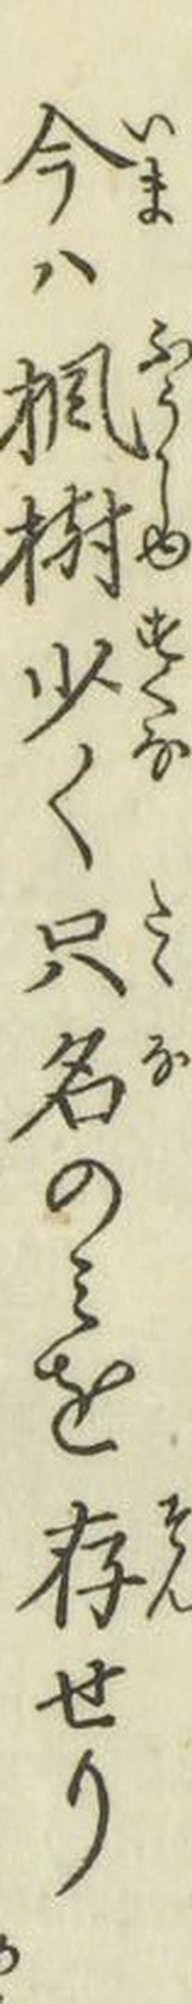今は楓樹少く只名のみを存せり
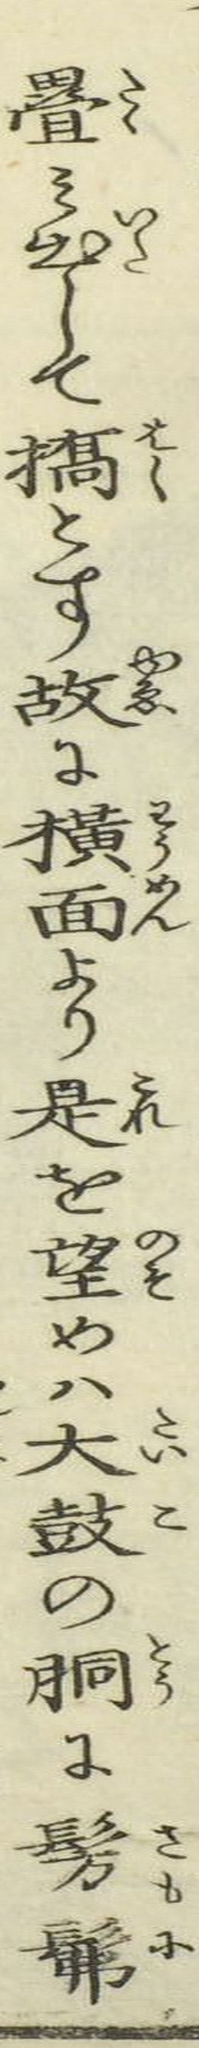畳み出して𣘺とす故に横面より是を望めは大鼓の胴に髣髴
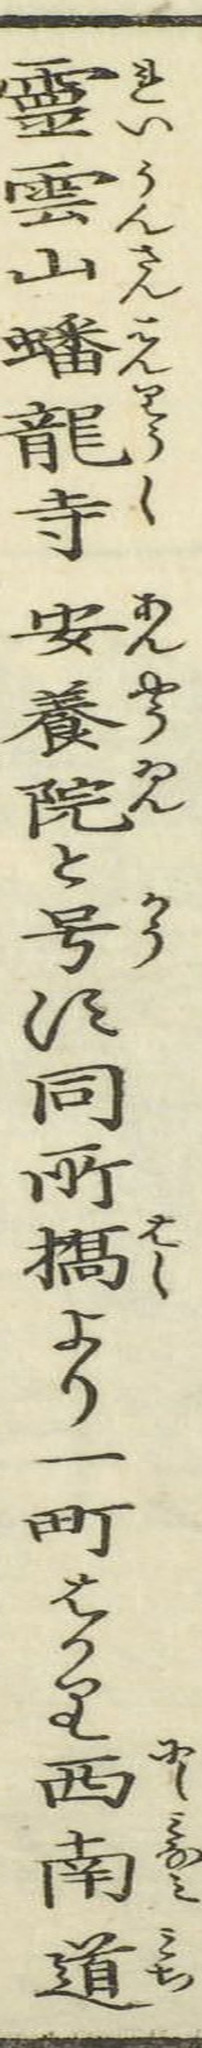靈雲山蟠龍寺安養院と号す同所𣘺より一町はかり西南道
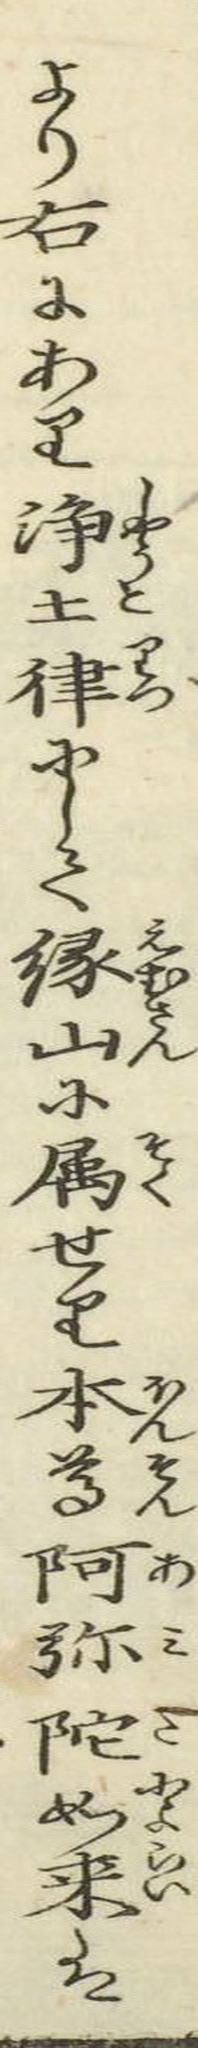より右にあり浄土律にして縁山に属せり本尊阿弥陀如来は
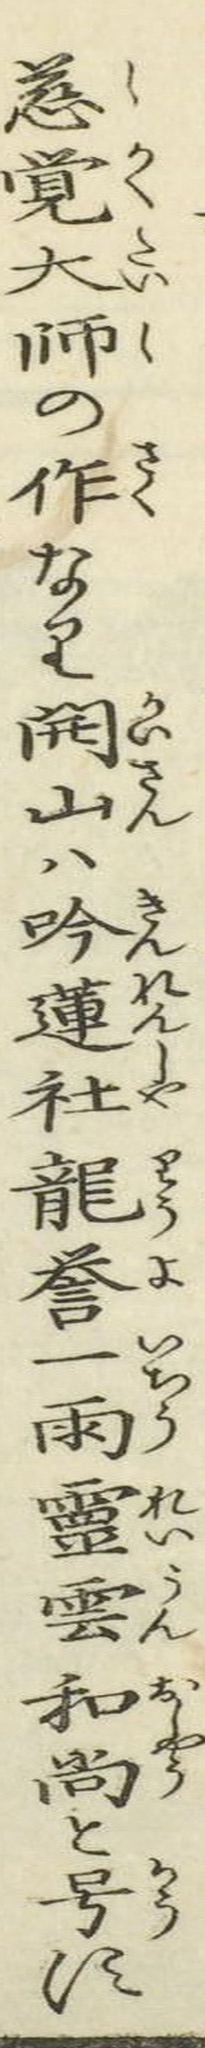慈覚大師の作なり開山は吟蓮社龍誉一雨靈雲和尚と号す
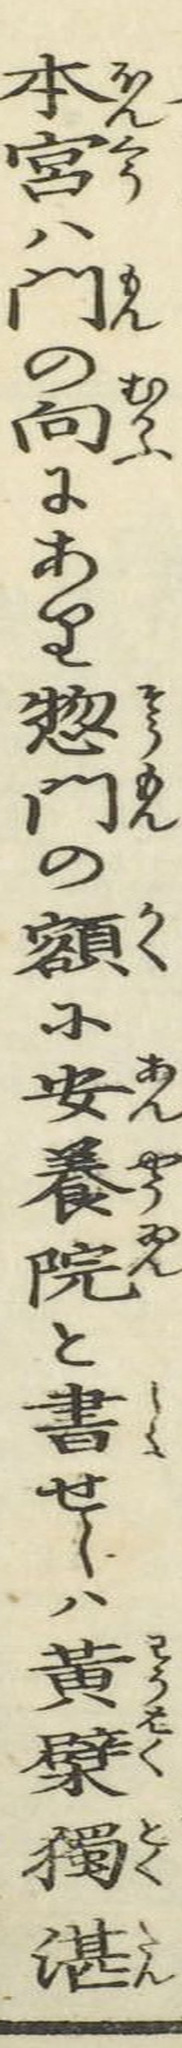本宮は門の向にあり惣門の額に安養院と書せしは黄檗獨湛
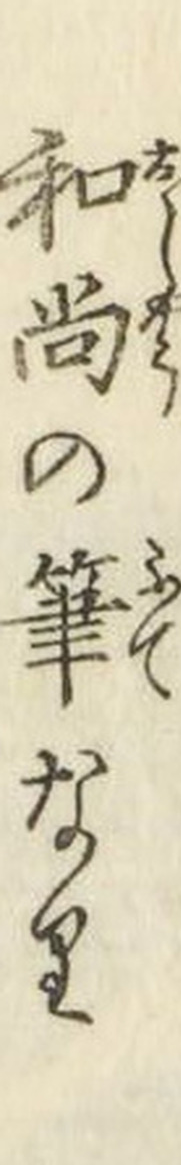和尚の筆なり
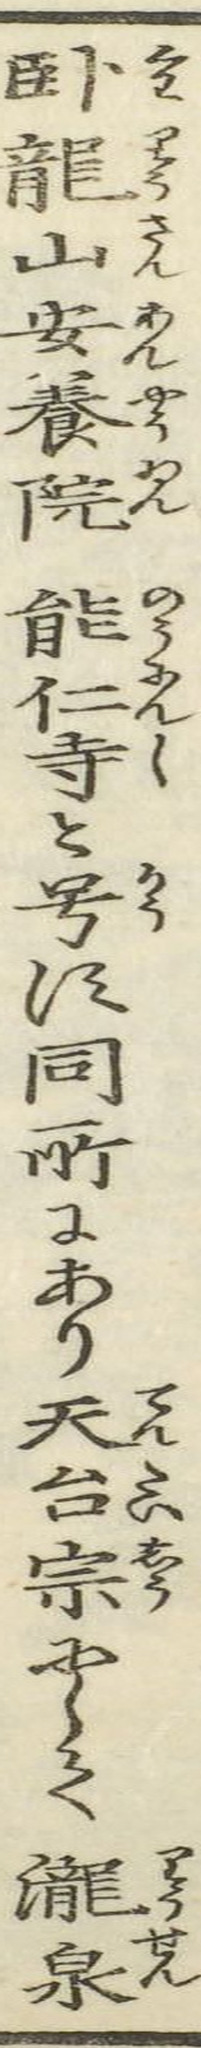臥龍山安養院能仁寺と号す同所にあり天台宗にして瀧泉
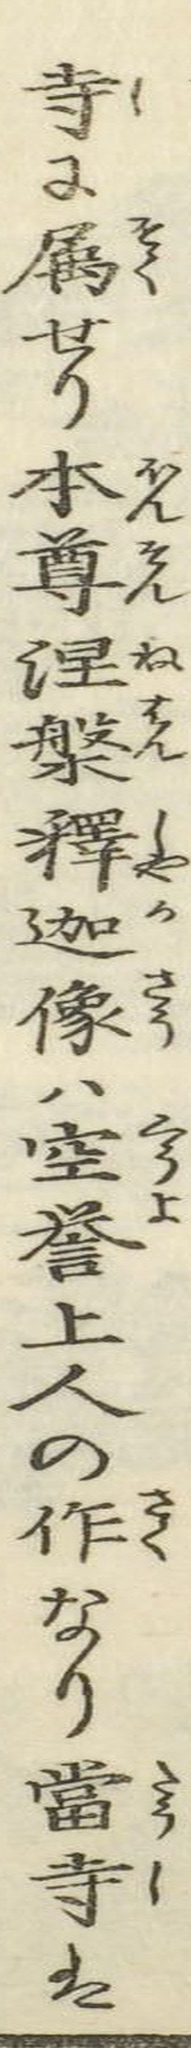寺に属せり本尊涅槃釋迦像は空誉上人の作なり當寺は
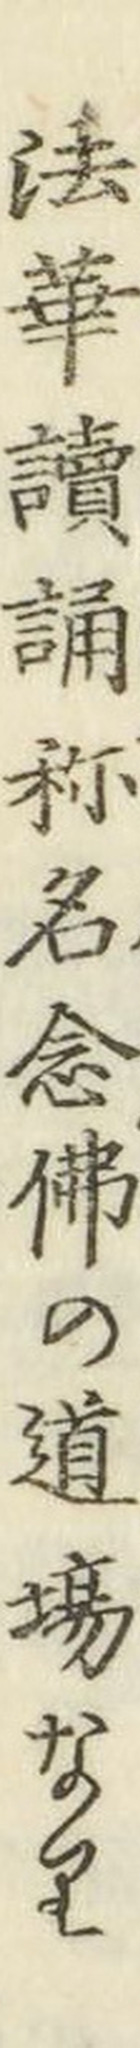法華讀誦称名念佛の道塲なり
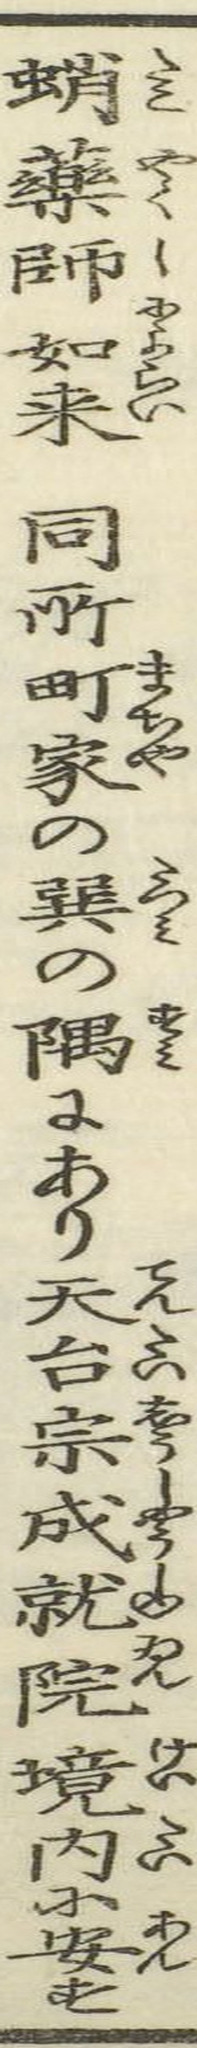蛸藥師如来同所町屋の巽の隅にあり天台宗成就院境内に安す
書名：江戸名所図会 20巻 巻之7
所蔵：東京学芸大学教育コンテンツアーカイブ
